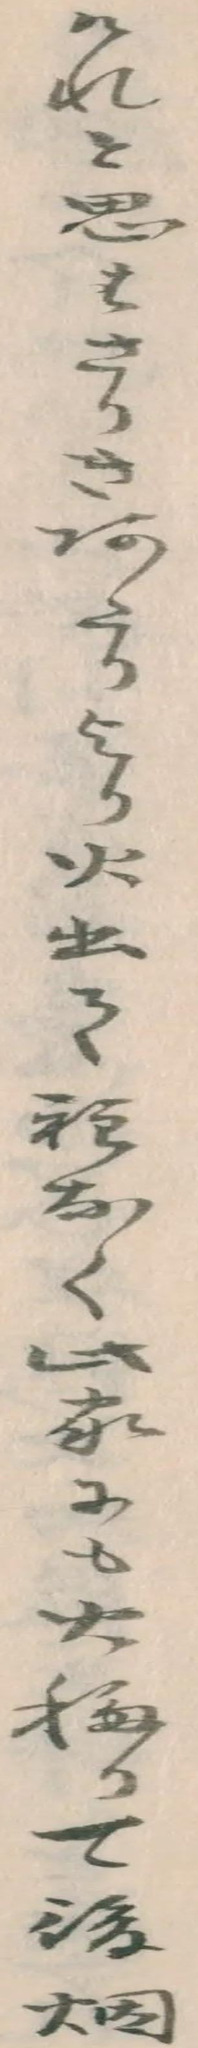けれと思はさりきあたりより火出て程なく此家にも火移りて後烟
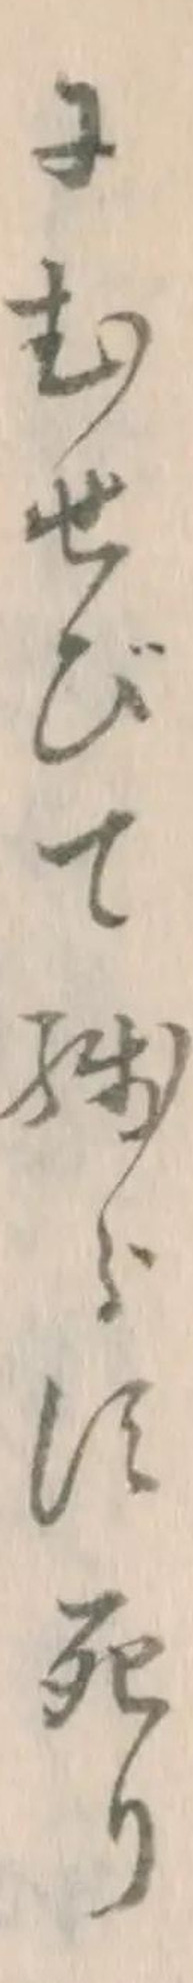にむせびて残らす死り
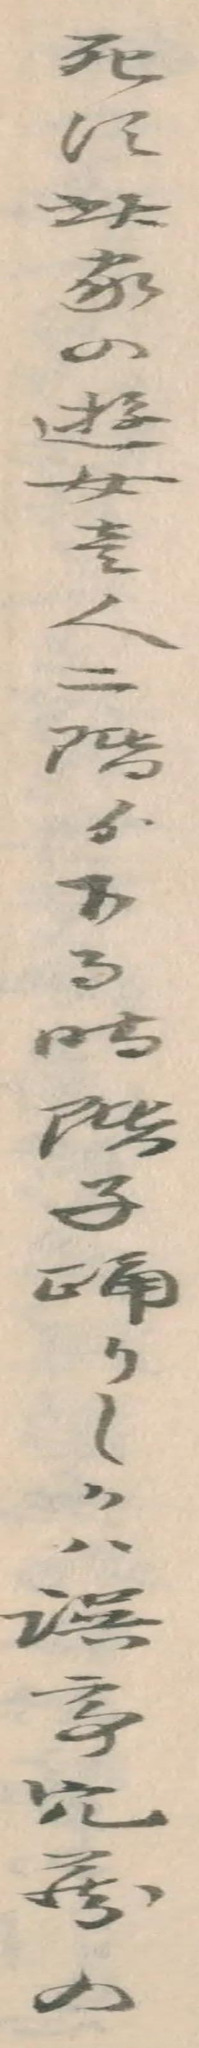死す此家の遊女壱人二階ゟ下る時階子踊りしかは誤て穴蔵の

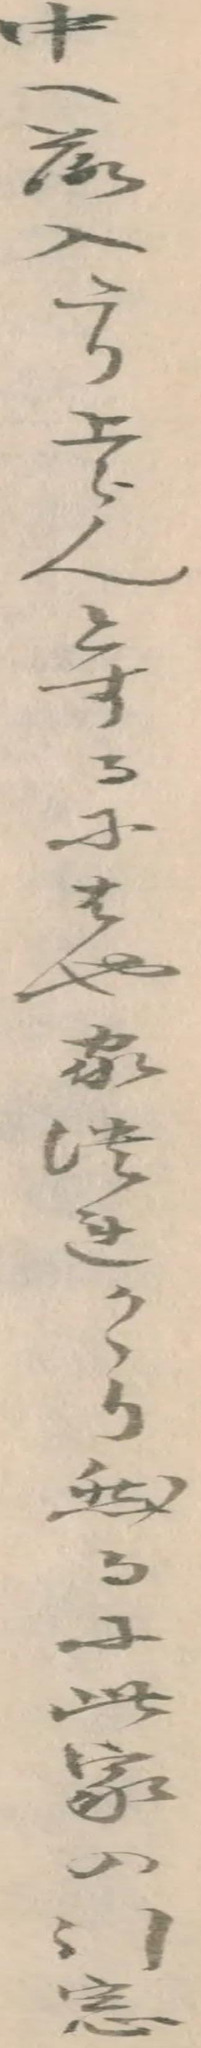中へ落入たり上らんとするにはや家潰れかゝり然るに此家の引窓
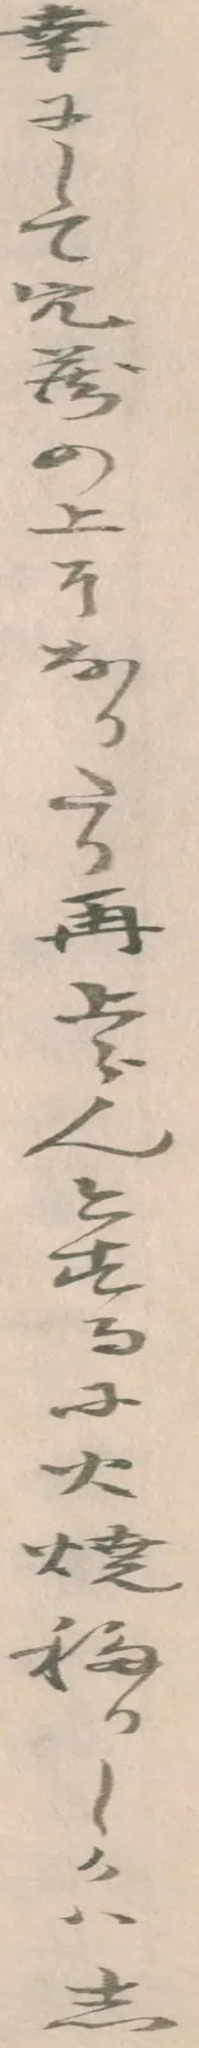幸にして穴蔵の上になりたり再上らんとするに火焼移りしかはし
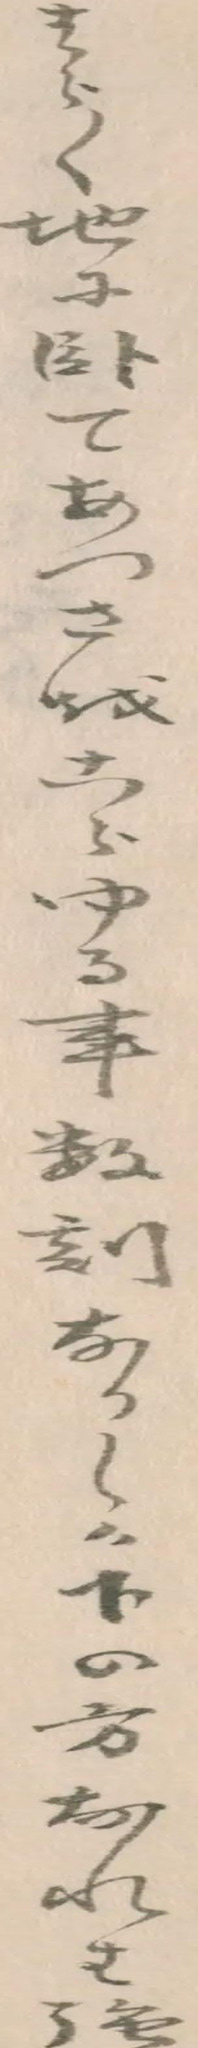はらく地に臥てあつさをこらゆる事数刻なりしか下の方なれは強
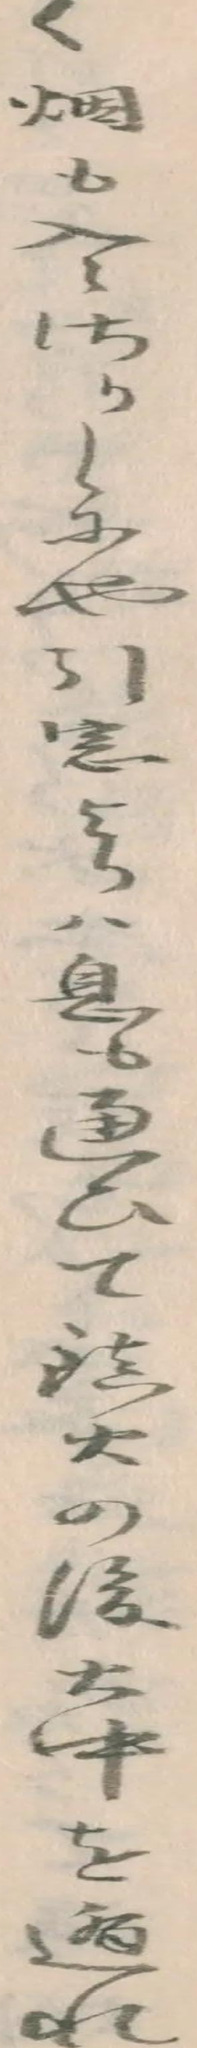く煙も入らさりしにや引窓よりは息も通ひて鎮火の後火中を遁れ
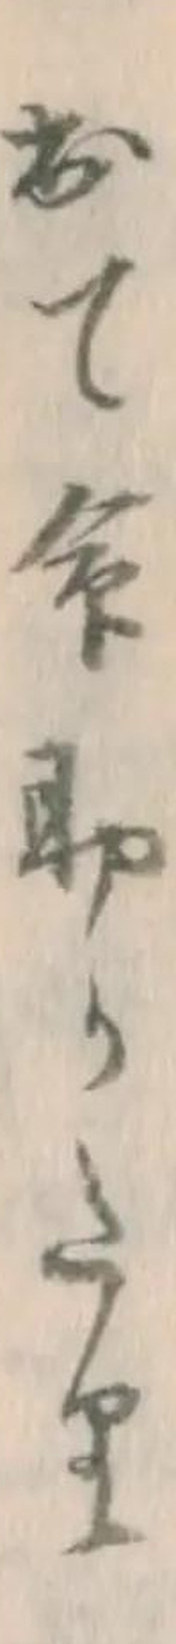出て命助りたり
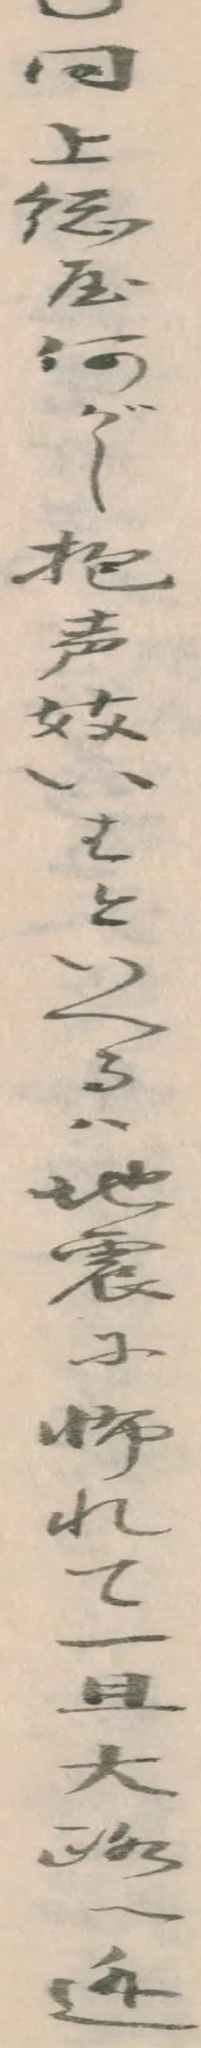〇同上総屋何がし抱声妓いはといへるは地震に怖れて一旦大路へ逃
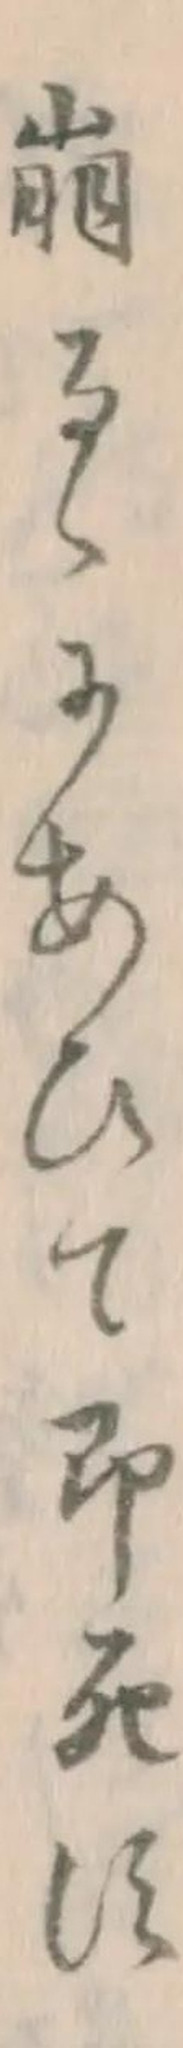崩るゝにあひて即死す
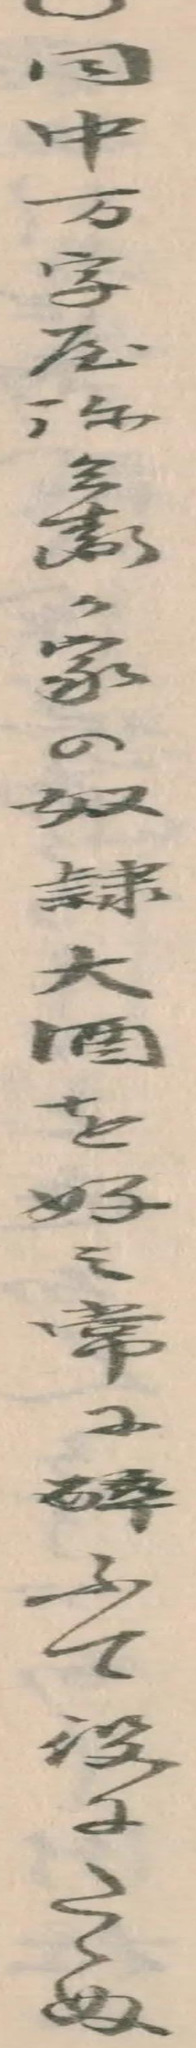〇同中万字屋弥兵衛か家の奴隷大酒を好み常に酔ふて役にたゝぬ
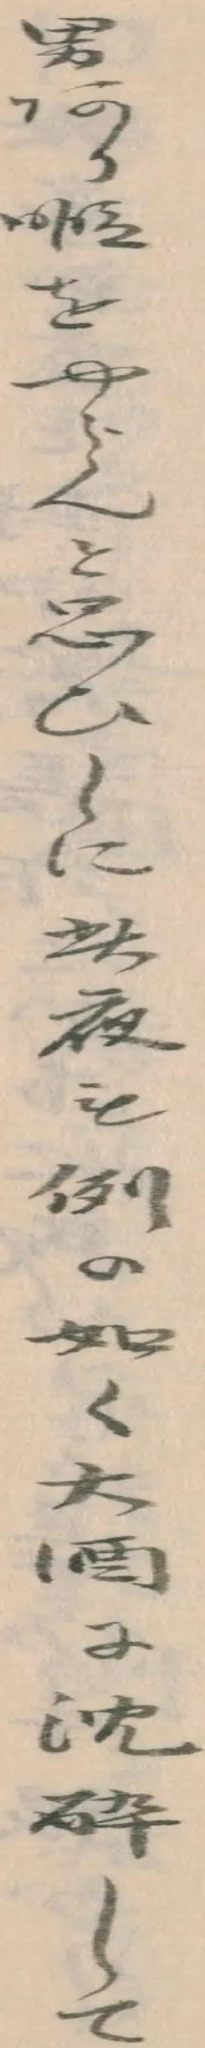男あり暇をやらんと思ひしに此夜も例の如く大酒に沈醉して
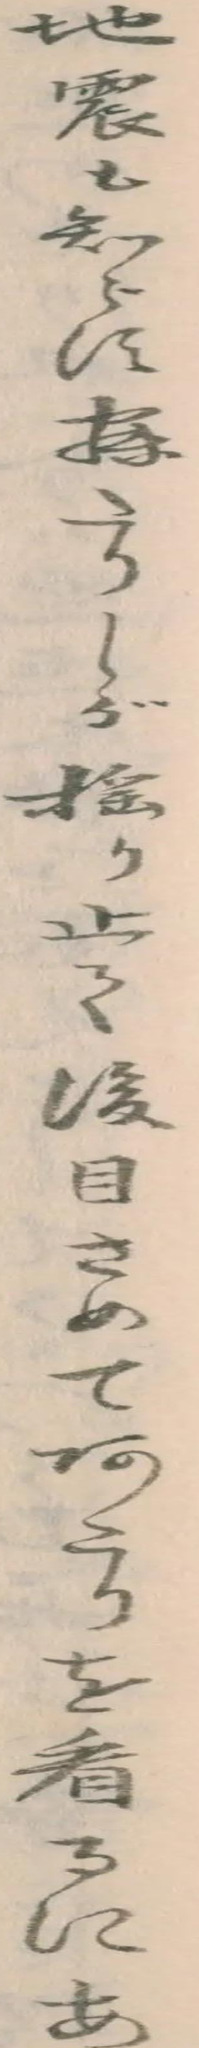地震も知らす寝たりしが揺り止て後目さめてあたりを看るにあ
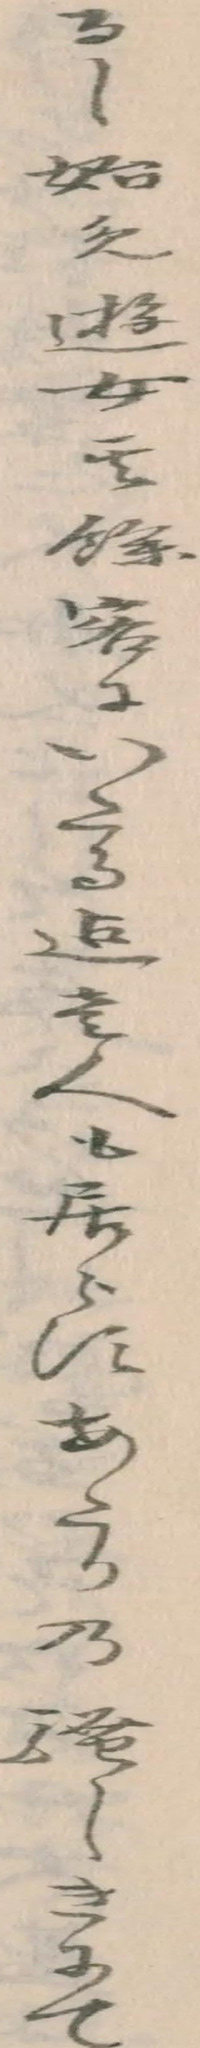るし始め遊女其余客にいたる迄壱人も居らすあたりの騒しきにて
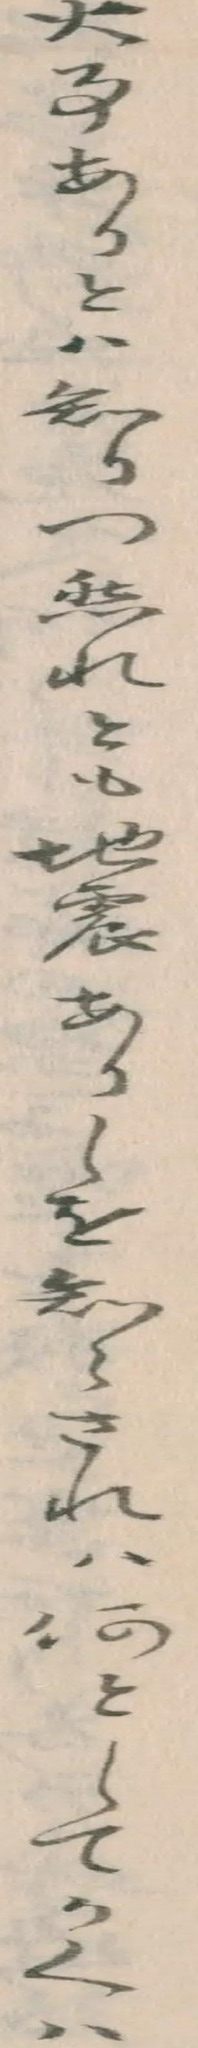火事ありとは知りつ然れとも地震ありしを知らされは何としてかくは
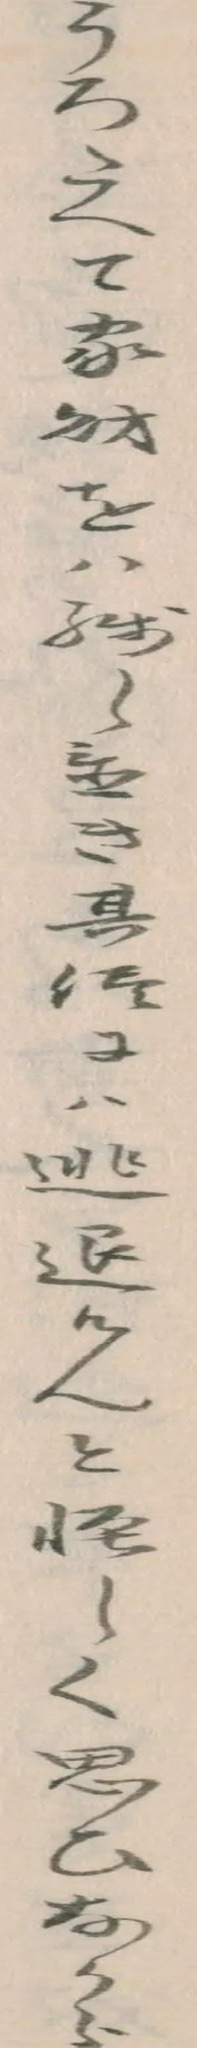うろたへて家財をは残し置き其侭には逃退けんと怪しく思ひなから
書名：地災撮要. 巻10(地震之部) 上,下
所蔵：国立国会図書館 National Diet Library, JAPAN
